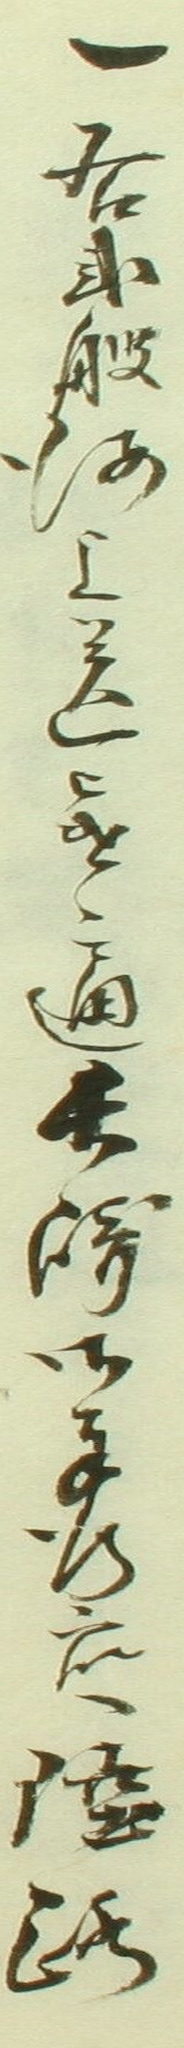一右弐艘海上送被遣候通長崎御奉行衆へ陸路
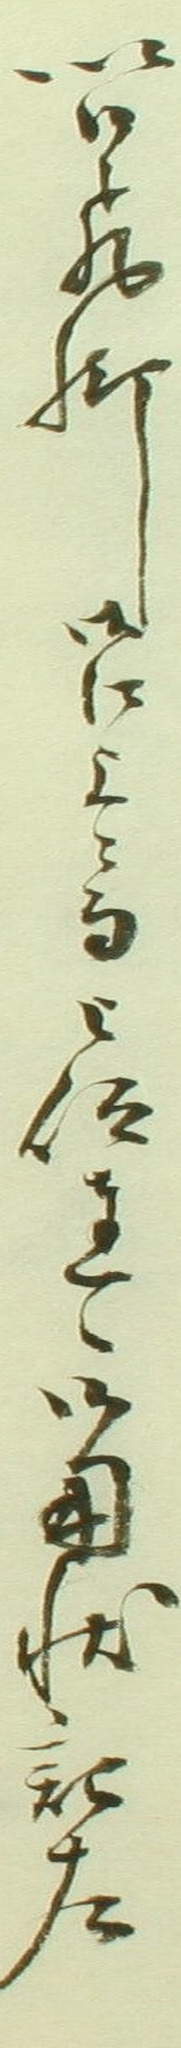以飛脚御口上ニ而被仰達候御用状記左
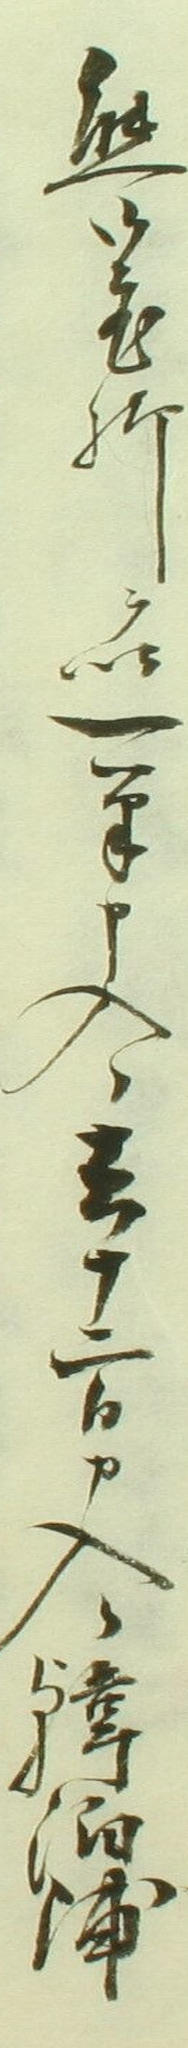態御飛脚ヲ以一筆申入候去十二日入候韓泊浦
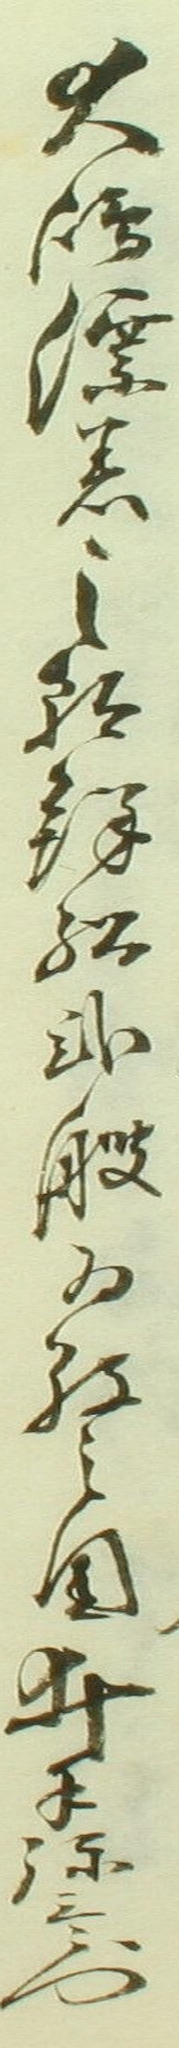大嶋漂着之朝鮮船弐艘為警固井手弥三衛門
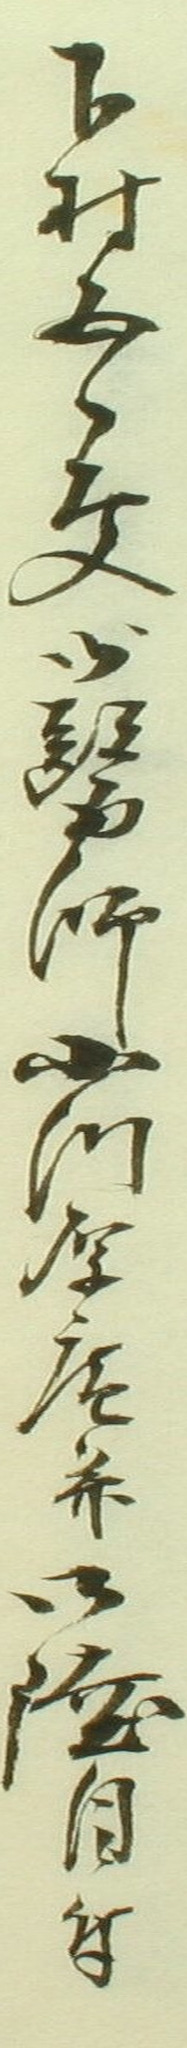下村五郎大夫御医師小川厚庵并御陸目付
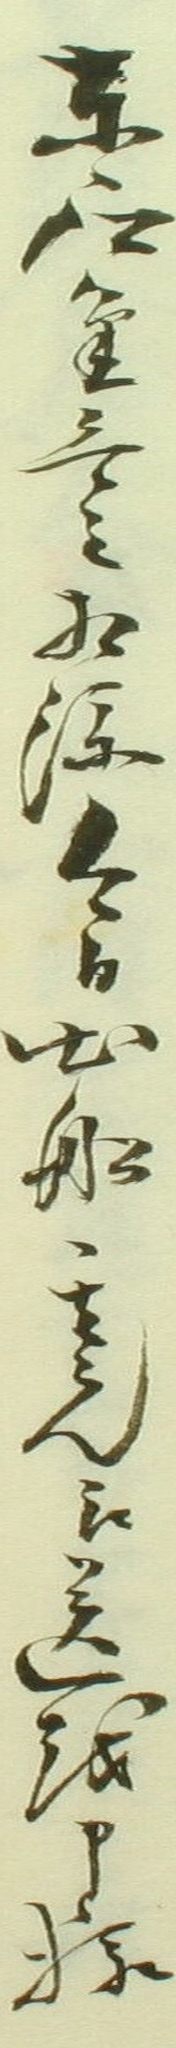東郷金相添今日出船其元被送越申候様
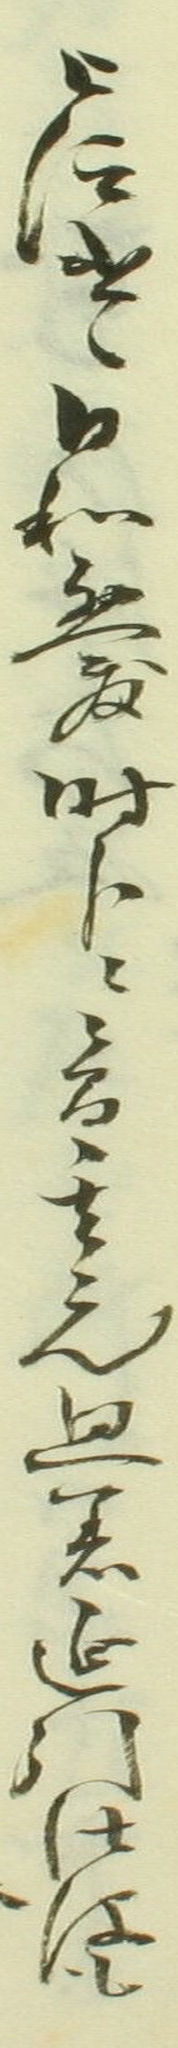被仰遣候日和悪敷時分ニ候間其元廻着延引仕儀も
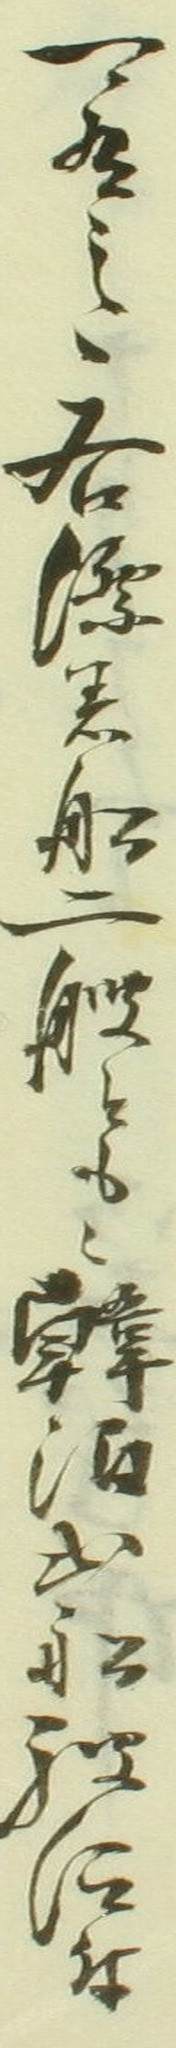可有之候右漂着船弐艘ともニ韓泊出船被仰付
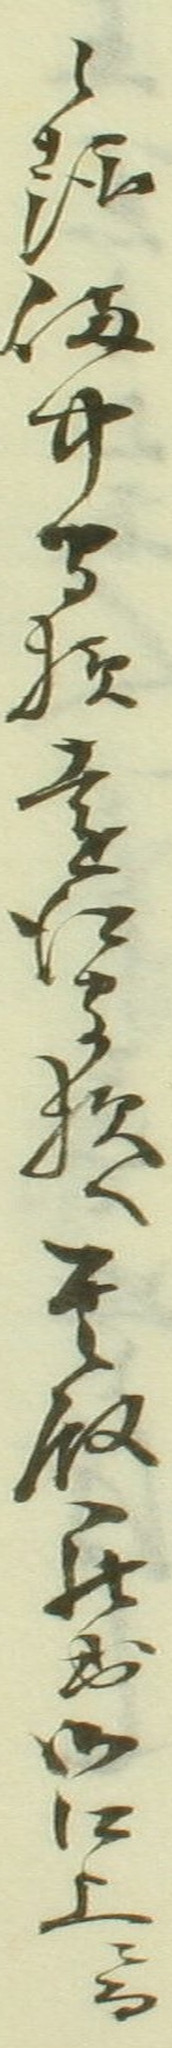候趣備中守様遠江守様へ其段罷出御口上ニ而
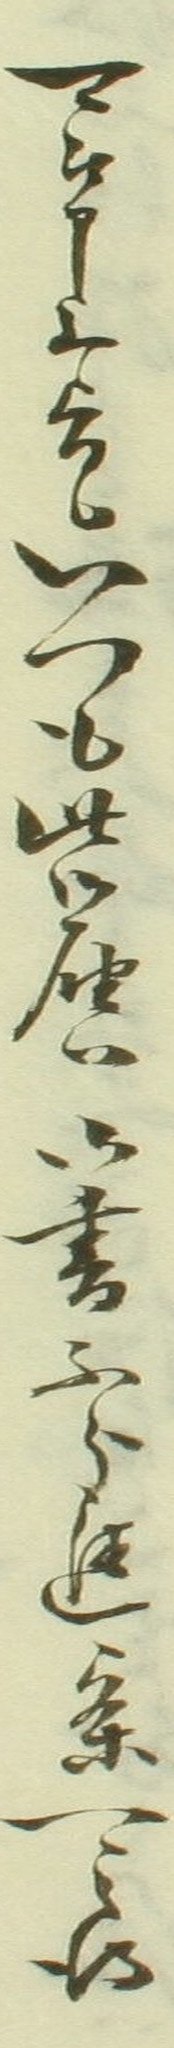可被申上旨候いつも此御届ハ御書不被進候条可被得
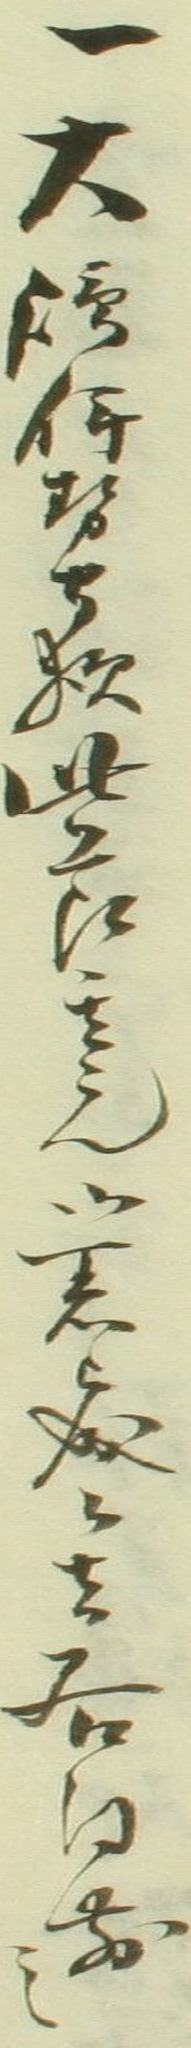一大嶋伊勢守様此節其元御着被成候者右同前之
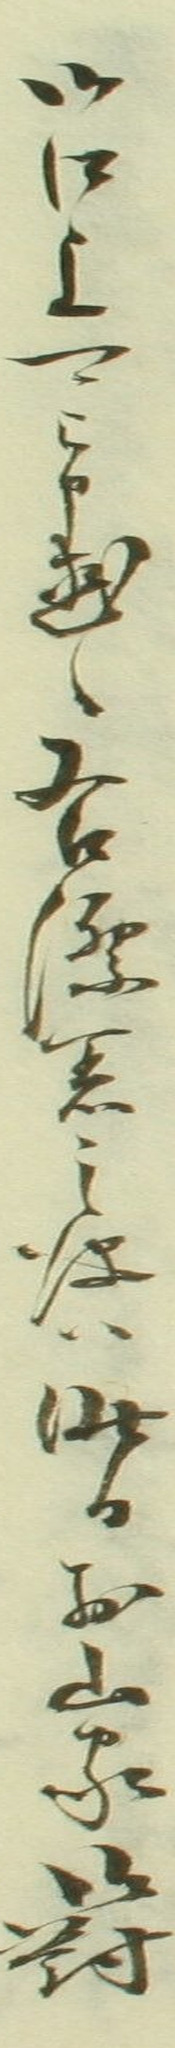御口上可被申述候右漂着之儀ハ昨日於山家御対
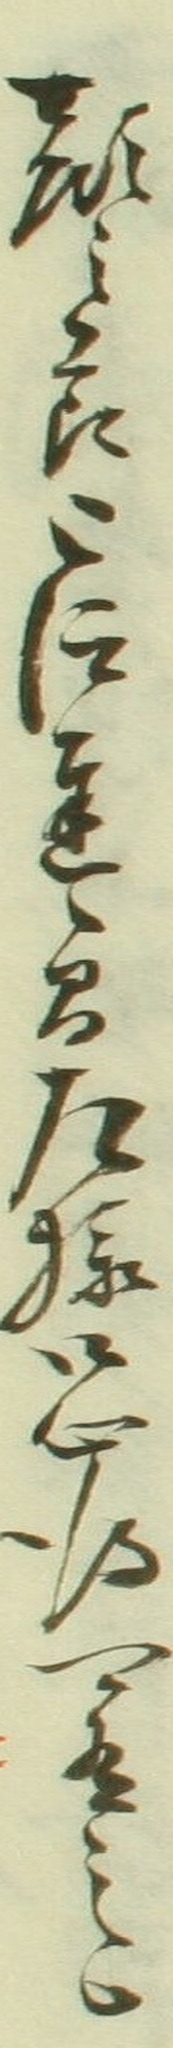顔之節被仰達候間左様御心得可有之候
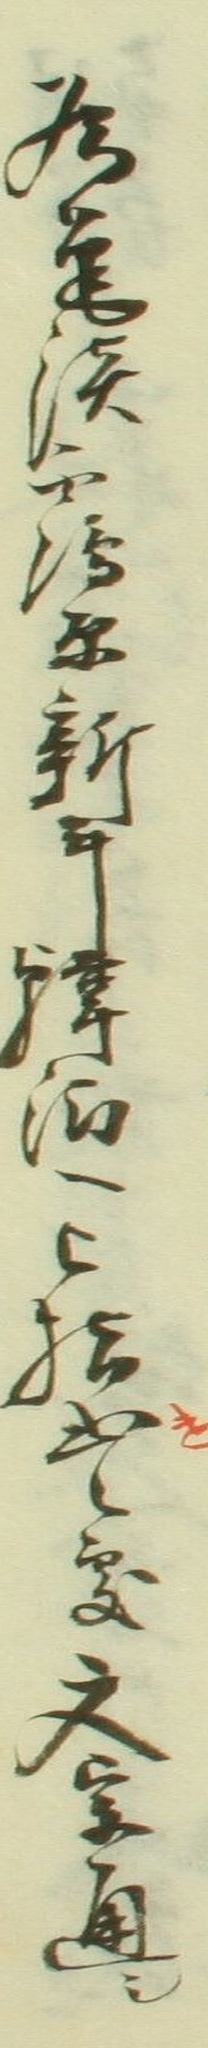一為筆談靏原新平韓泊へ被指出候処文字通シ
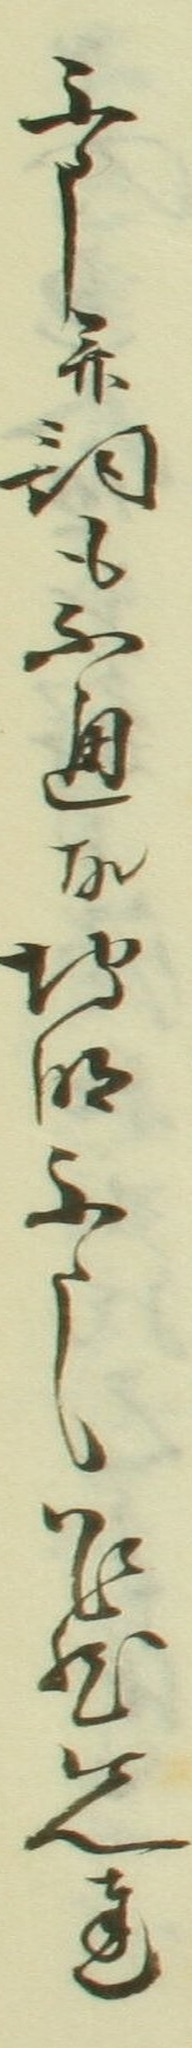不申并詞も不通故埒明不申候乍然先達

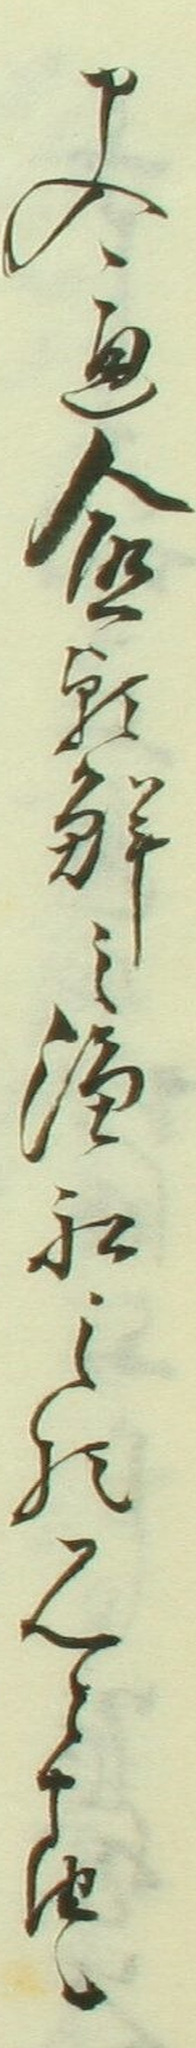申入候通愈朝鮮之漁船之様見と申由候
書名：異国船漂着記
